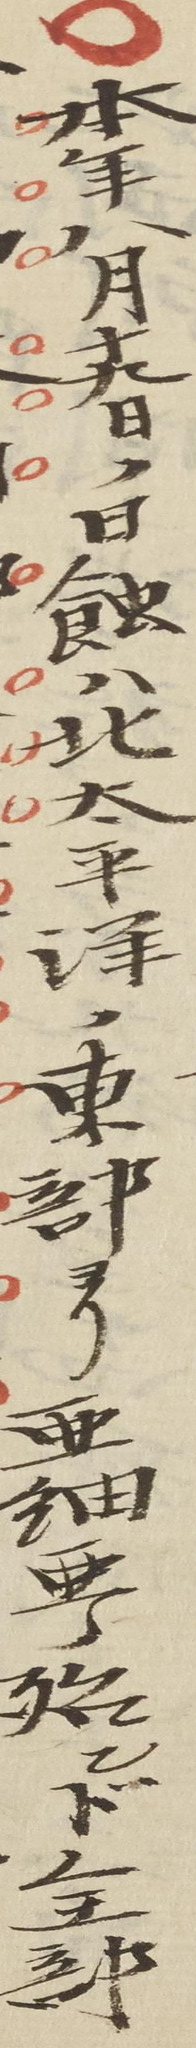○本年八月十九日ノ日蝕ハ北太平洋ノ東部ヨリ亜細亜ノ殆ンド全部
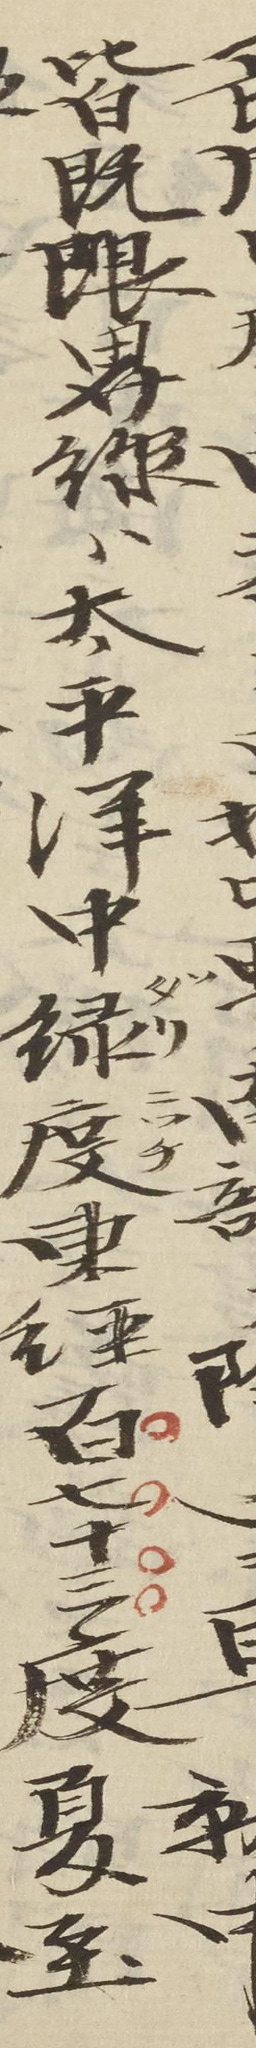皆既限界線ハ太平洋中緑度東経百七十三度夏至
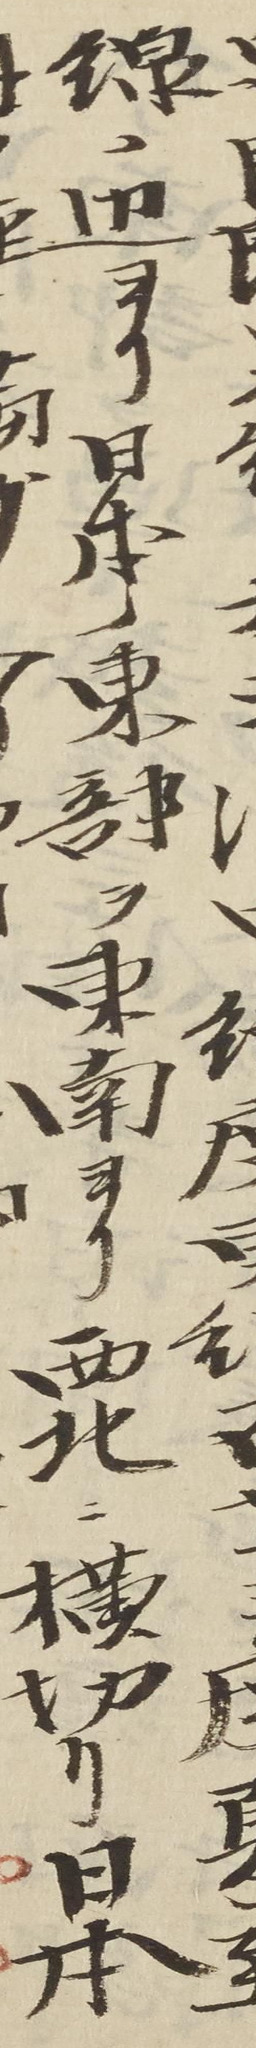線ノ辺ヨリ日本ノ東部ヲ東南ヨリ西北ニ横切リ日本
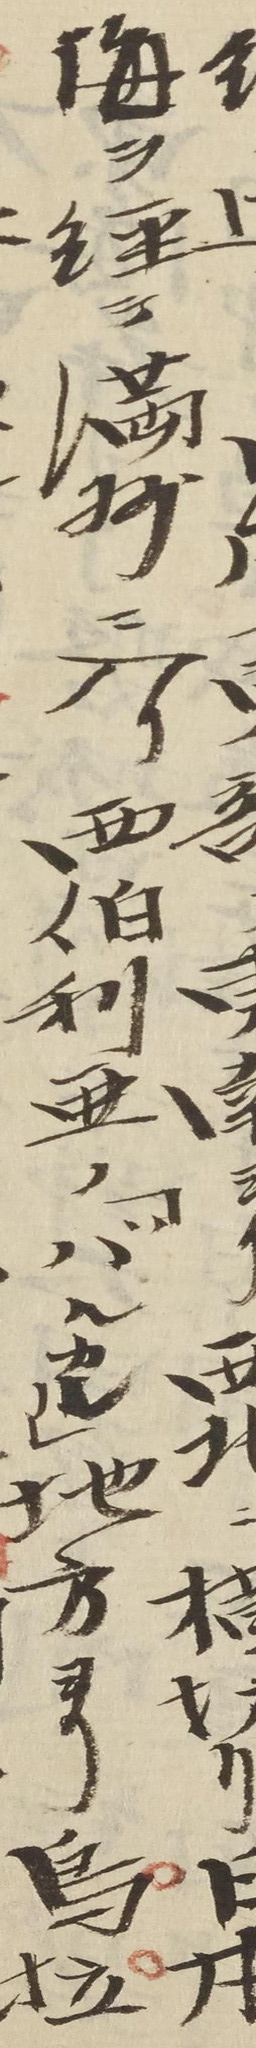海ヲ経テ満州ニ入リ西伯利亜ノ「バルカン」地方ヨリ烏拉

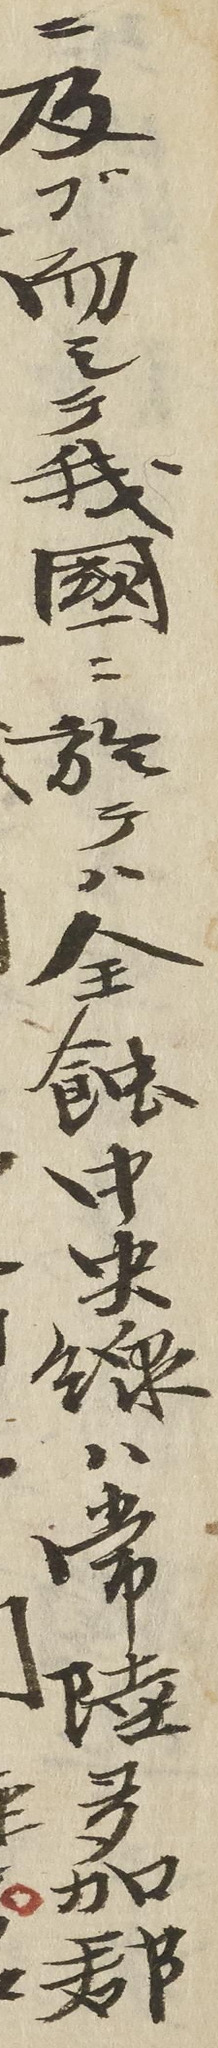ニ及ブ而シテ我国ニ於テハ全蝕中央線ハ常陸多加郡
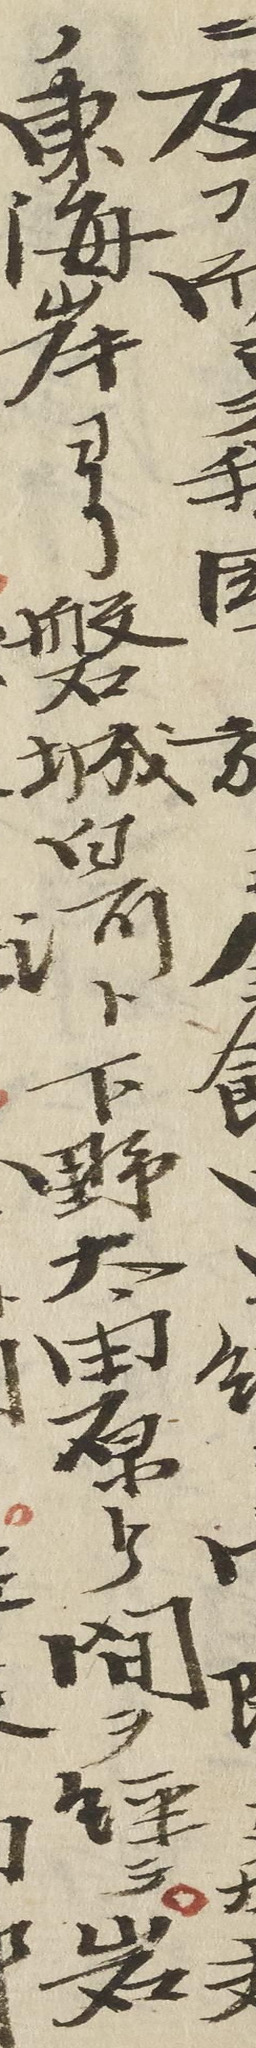ノ東海岸ヨリ岩城白河ト下野太田原トノ間ヲ経テ。岩
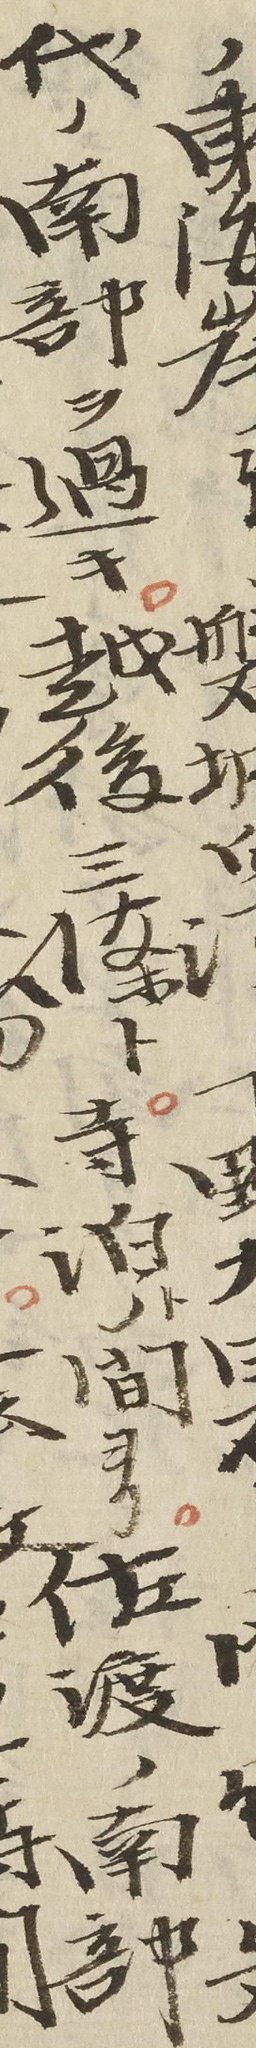代ノ南部ヲ過キ。越後三條ト。寺泊トノ間ヨリ佐渡ノ南部
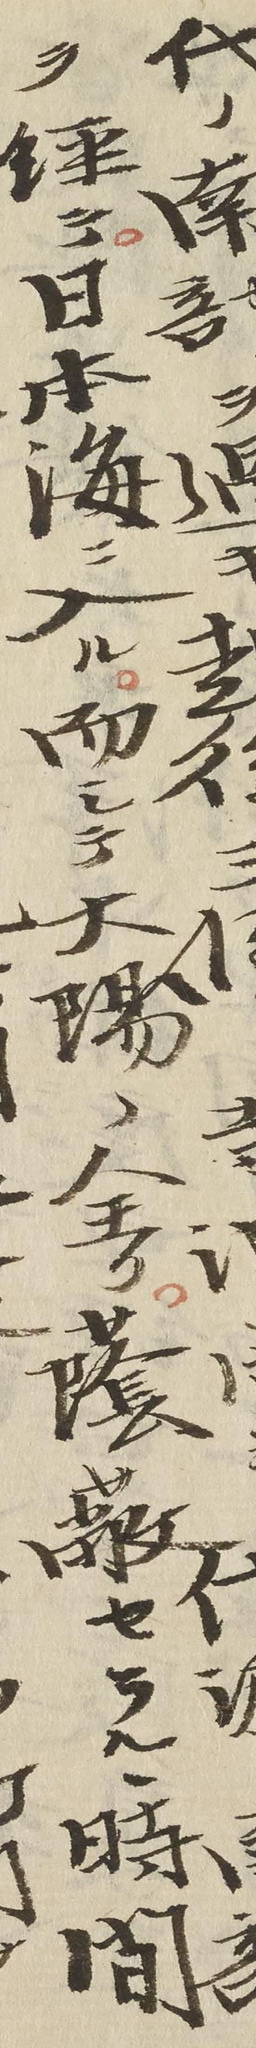ヲ経テ。日本海ニ入ル。而シテ大陽ノ全ク。蔭蔽セラルヽ時間
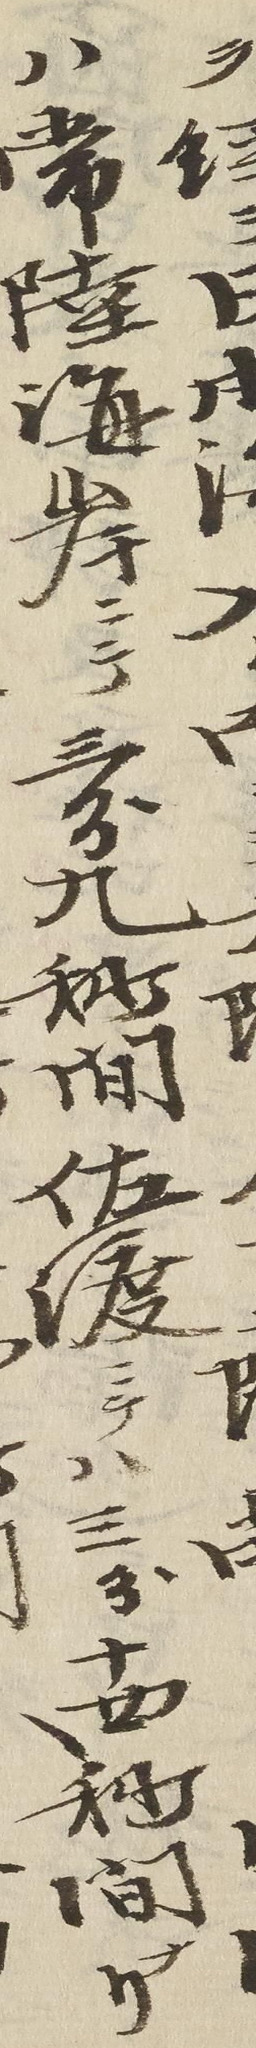ハ常陸海岸ニテ三分九秒間佐渡ニテハ三分十四秒間ナリ
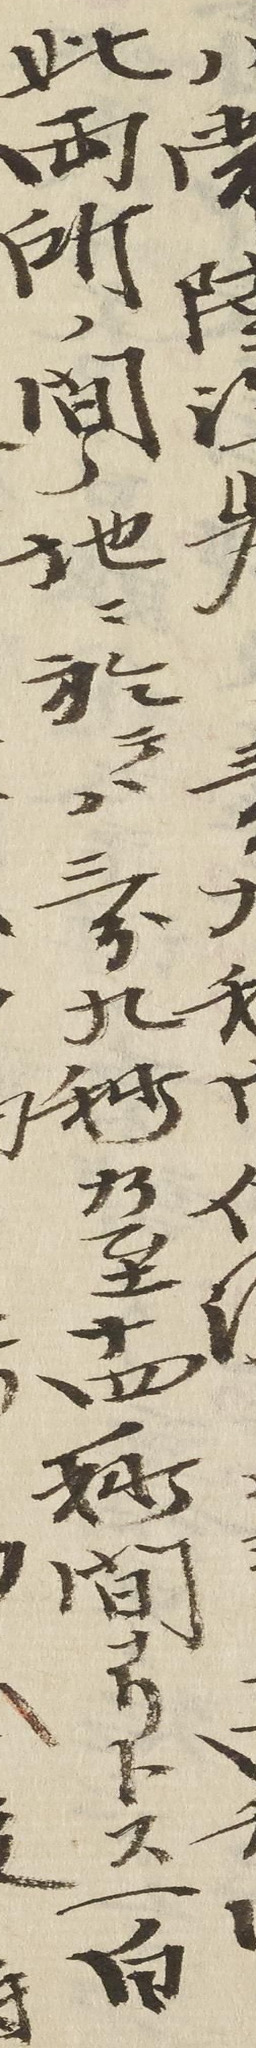此両所ノ間ノ地ニ於テハ三分九秒乃至十四秒間ナリトス（白
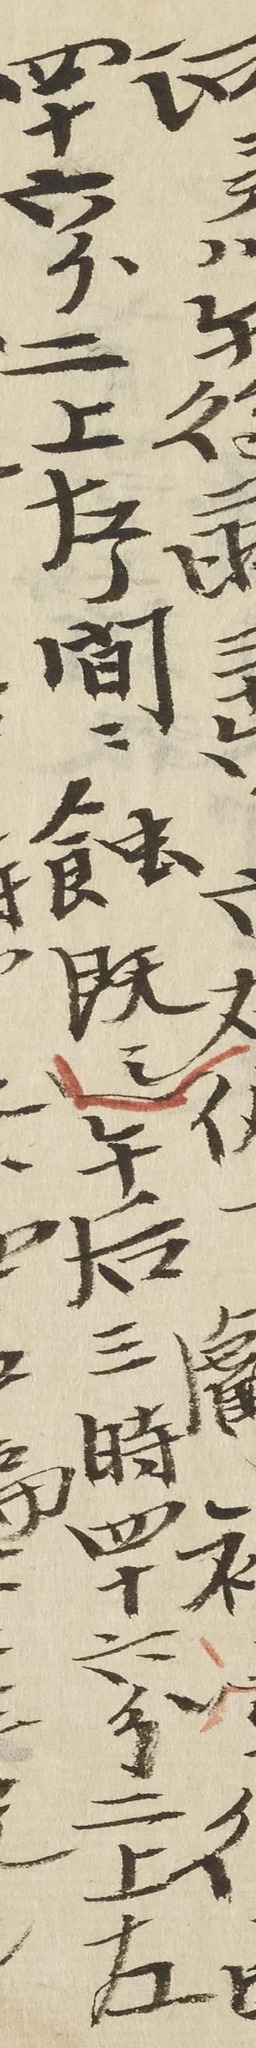四十六分二上左ノ間ニ蝕既シ〕午后三時四十六分二上左
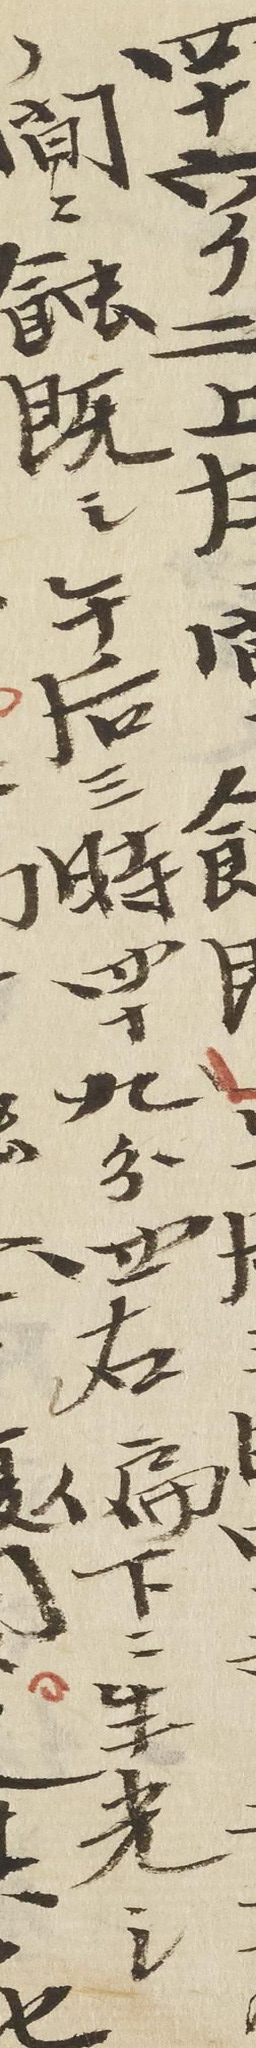ノ間ニ蝕既シ午后三時四十九分四右偏下ニ生光シ
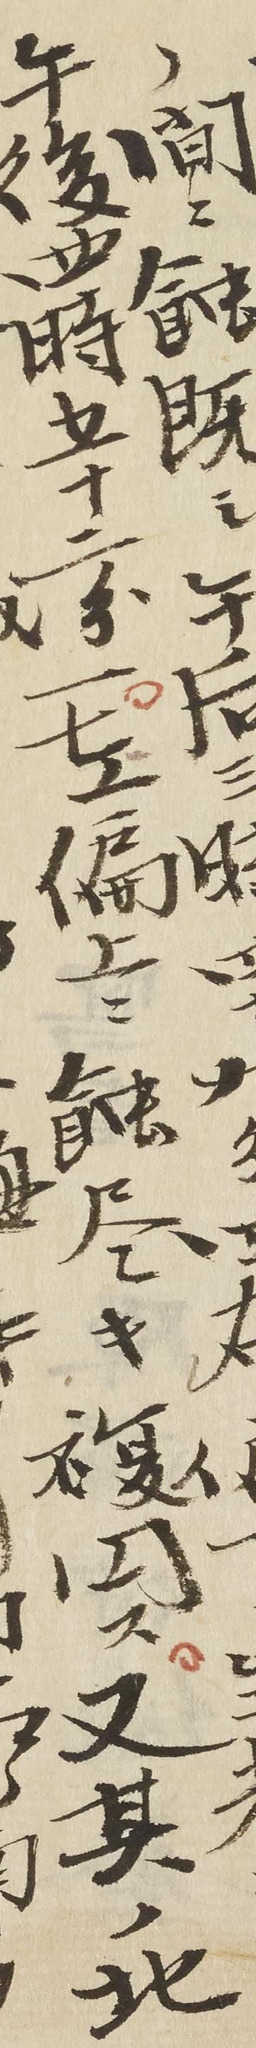午後四時五十二分一。左偏上ニ蝕尽キ複円ス。又其ノ北
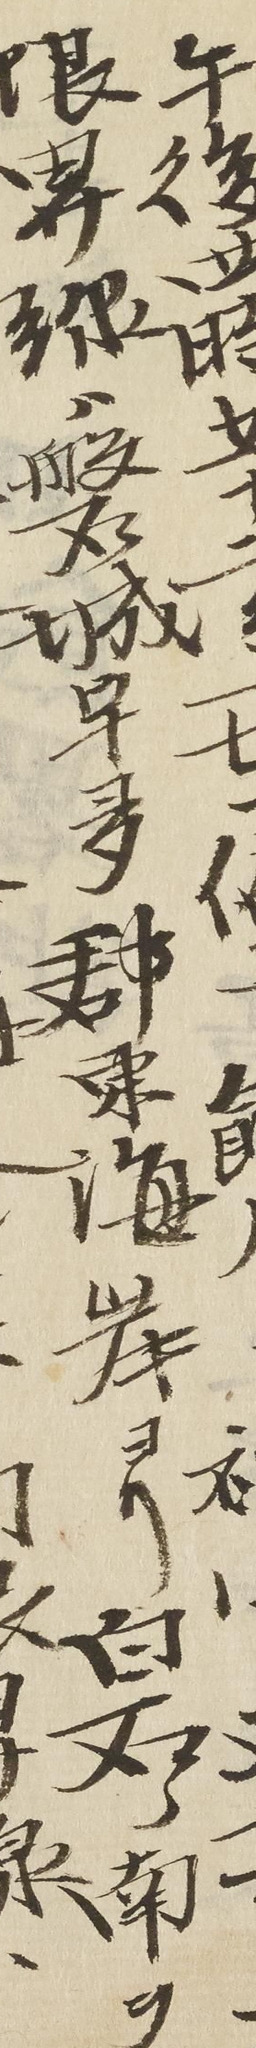限界線ハ磐城宇多郡東海道岸ヨリ白石ノ南ヲ
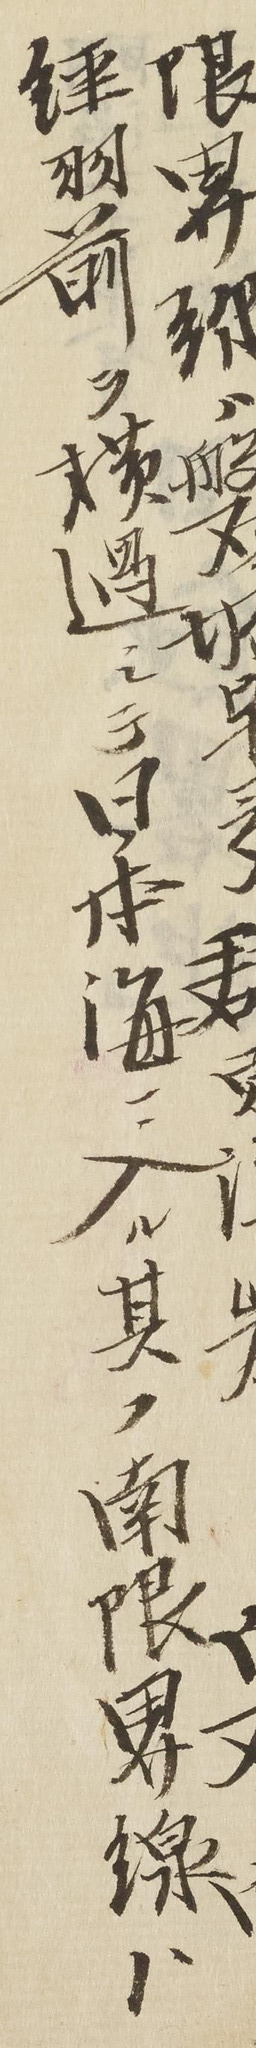経羽前ヲ横過シテ日本海ニ入ル其ノ南限界線ハ

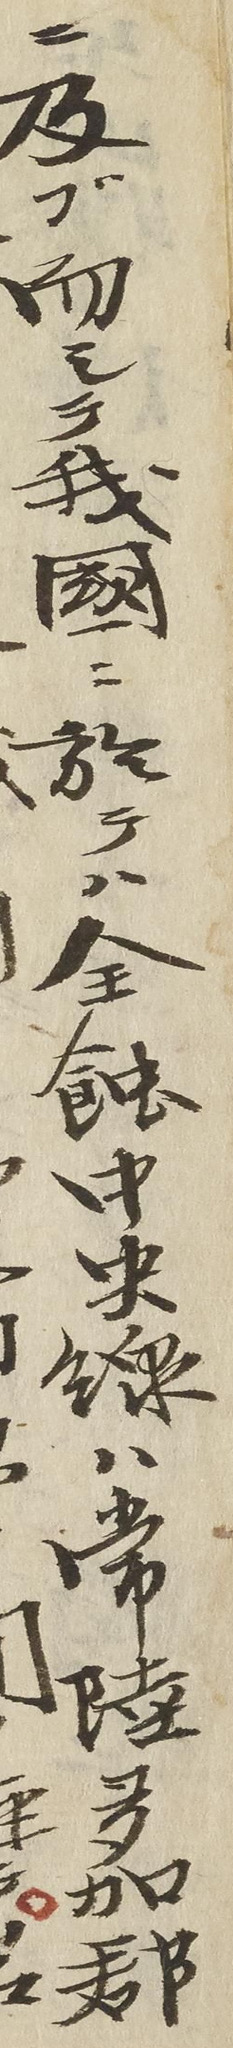ニ及ブ而シテ我国ニ於テハ全蝕中央線ハ常陸多加郡
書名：日蝕録　全
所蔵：東京大学地震研究所図書室 Earthquake Research Institute Library, The University of Tokyo, JAPAN
